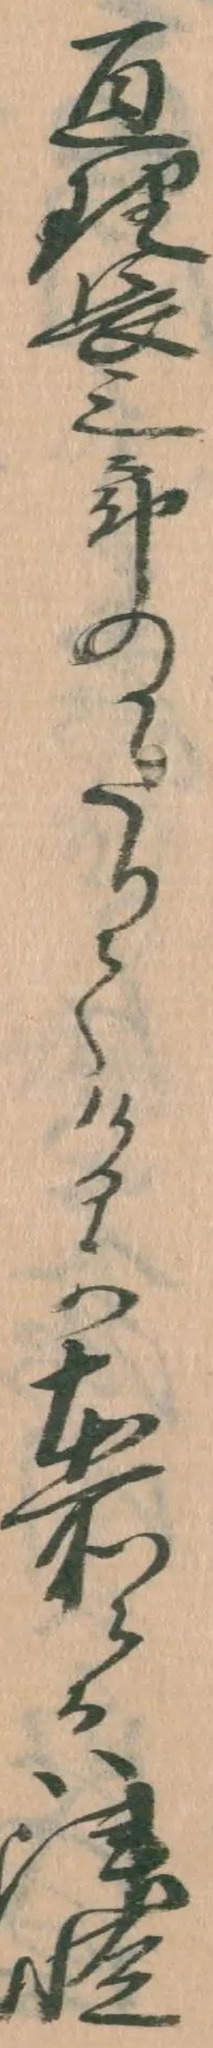直野長三郎のかたりてけるか本所ニ而ハ津輕
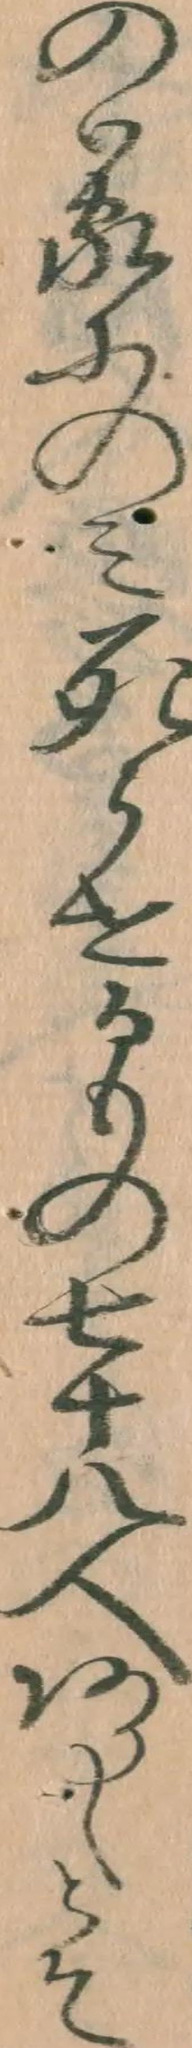の御家にのミ死うせるもの七十八人ありしとそ
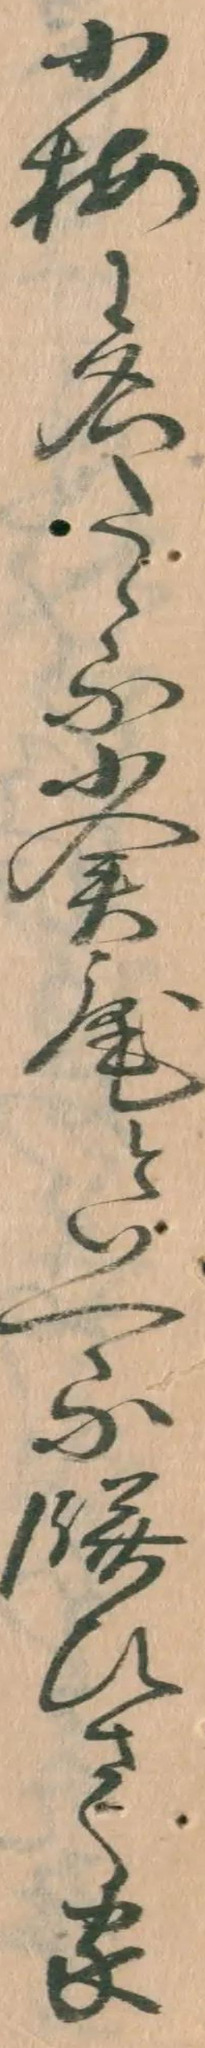小梅に名たゝる小倉屋といへる餅ひさく家
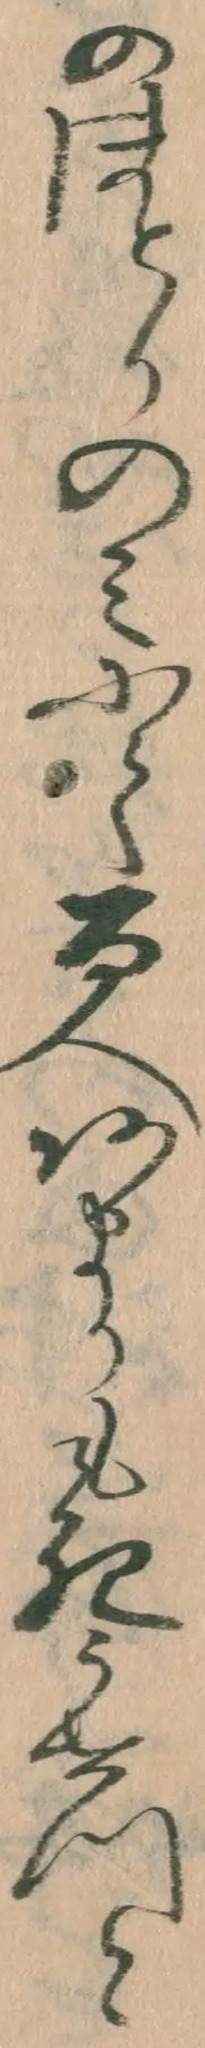のほとりのミにて百人あまりも死うせつと
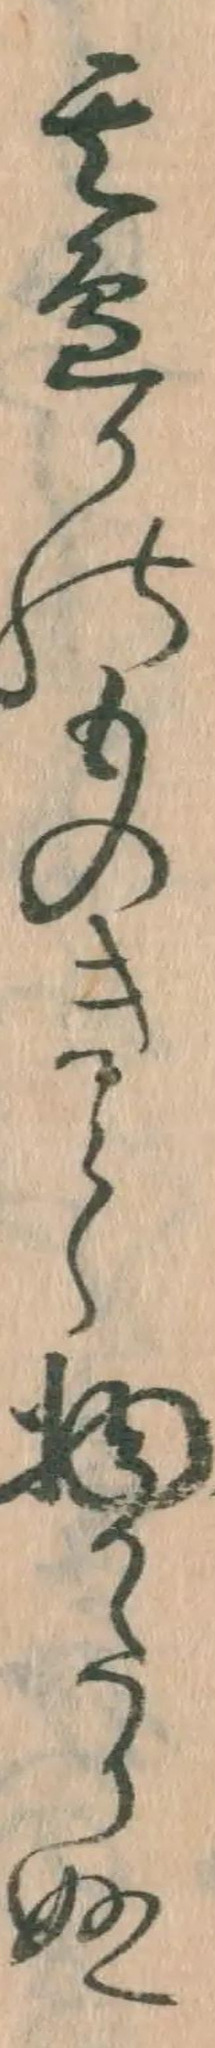其邊りのものきて物かたりぬ
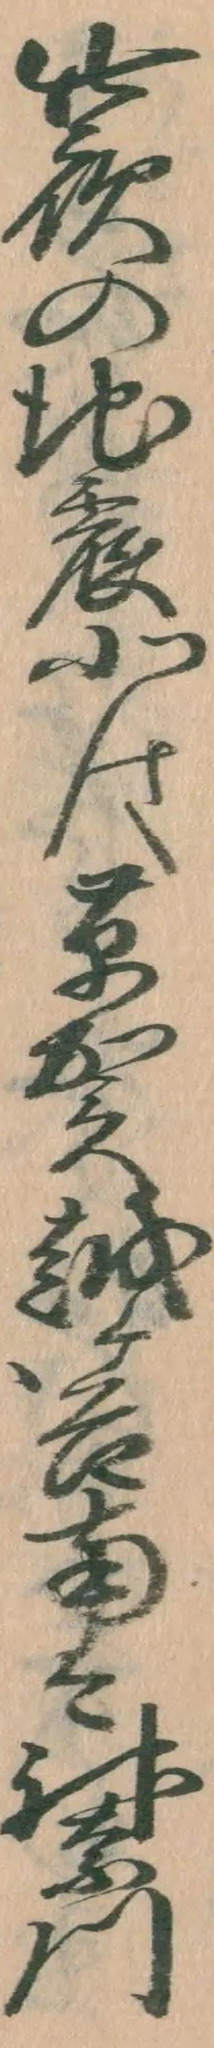此夜の地震北は草賀越ヶ谷南は神奈川
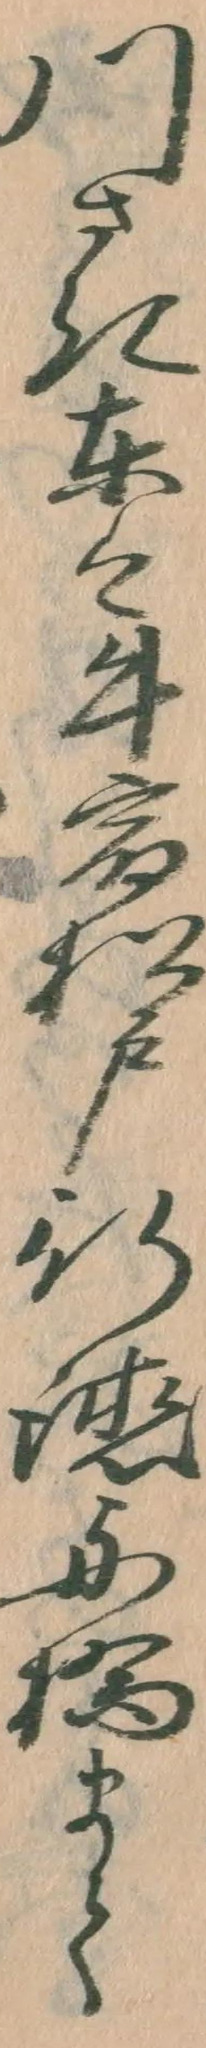川さき東は牛宿松戸行徳船橋まて
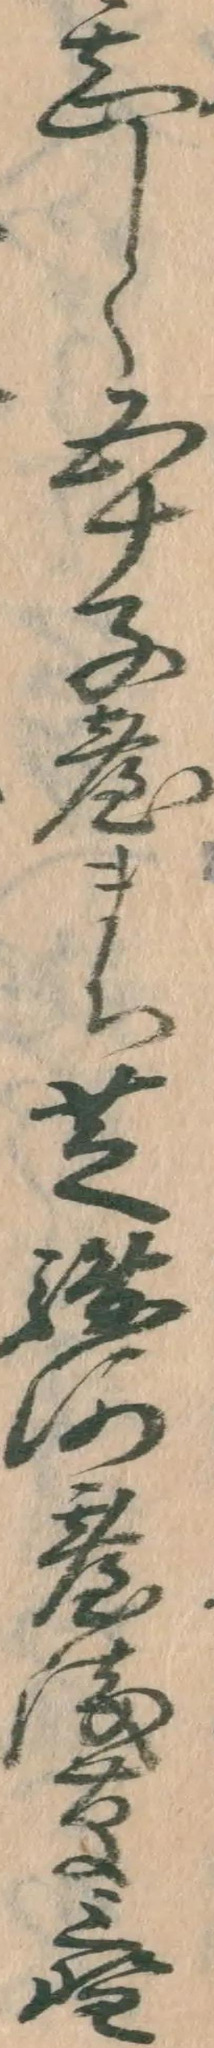甚しく五十子臺まち芝駿河臺浅草上野
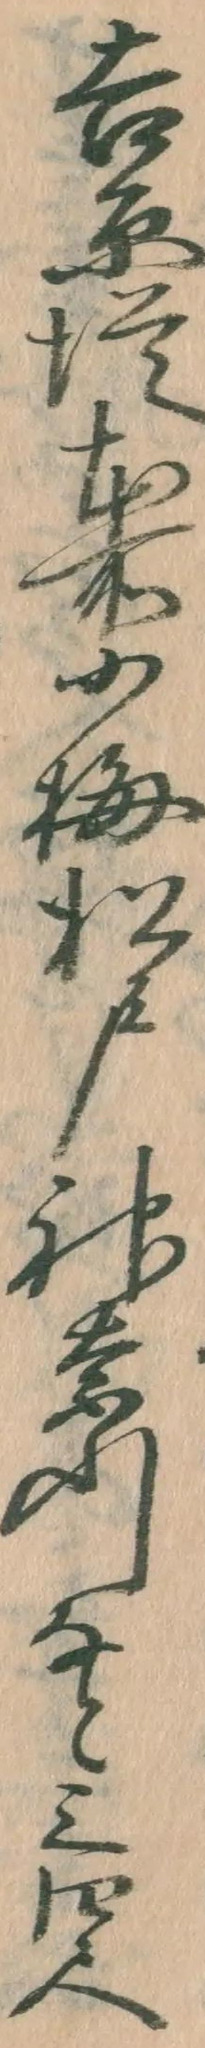吉原堤本所小梅松戸神奈川なと三四尺
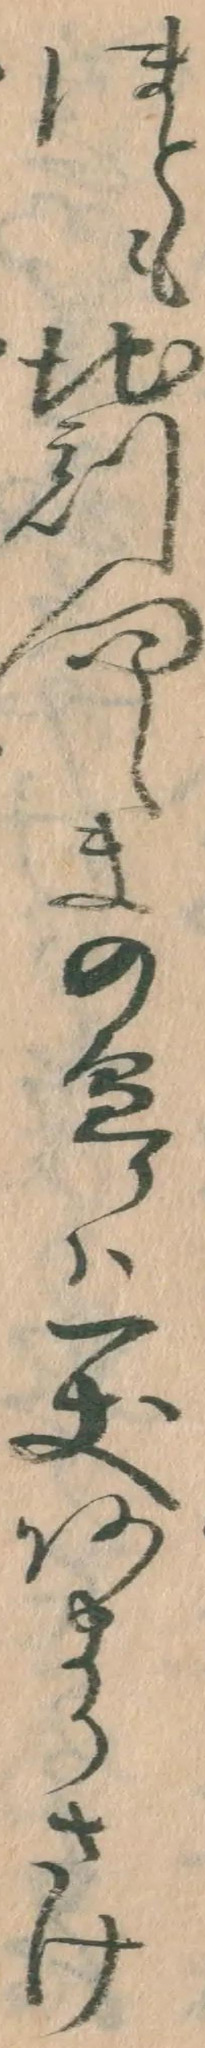ほとも地割向しまの邊りハ一丈あまりさけ
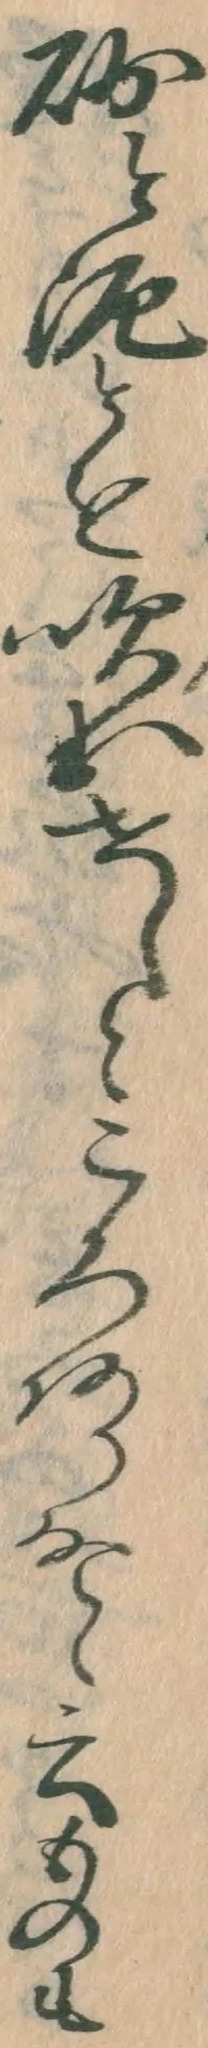砂と泥とを吹出せしところありなと云ものも
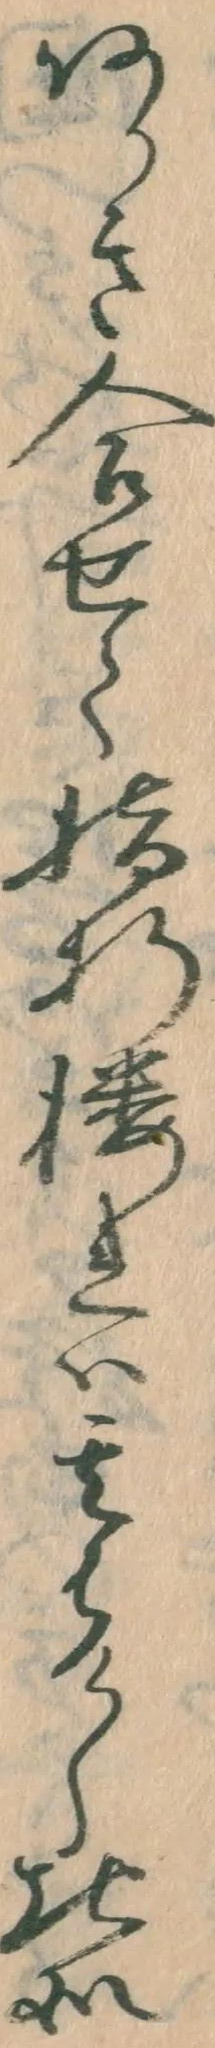ありき合せて指折搂れハ其はけしき処
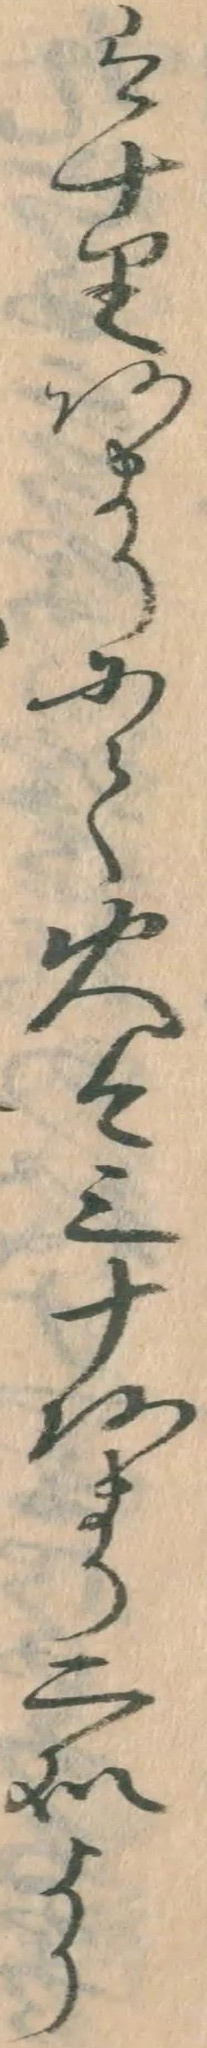は十里あまりにて火は三十あまり二処より
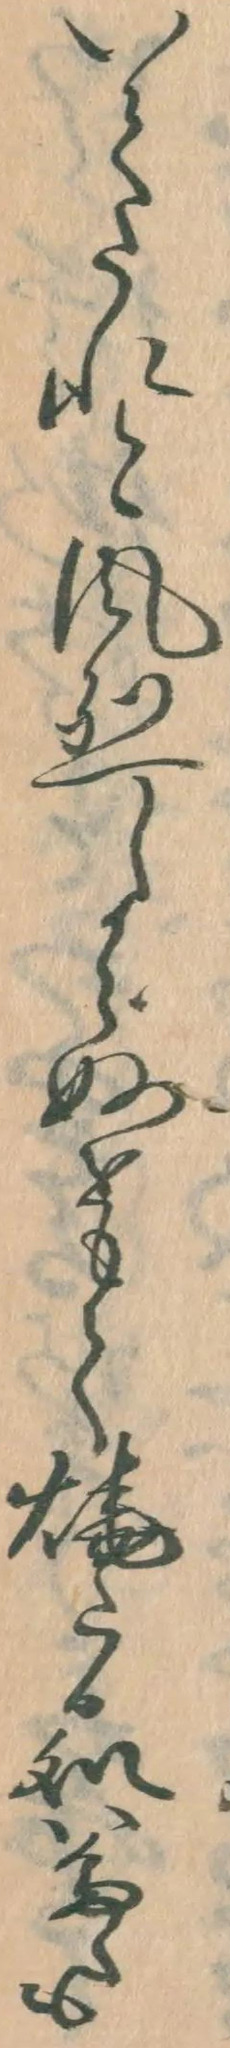いてたれと風烈しからぬをもて燒たる処ハ多くも

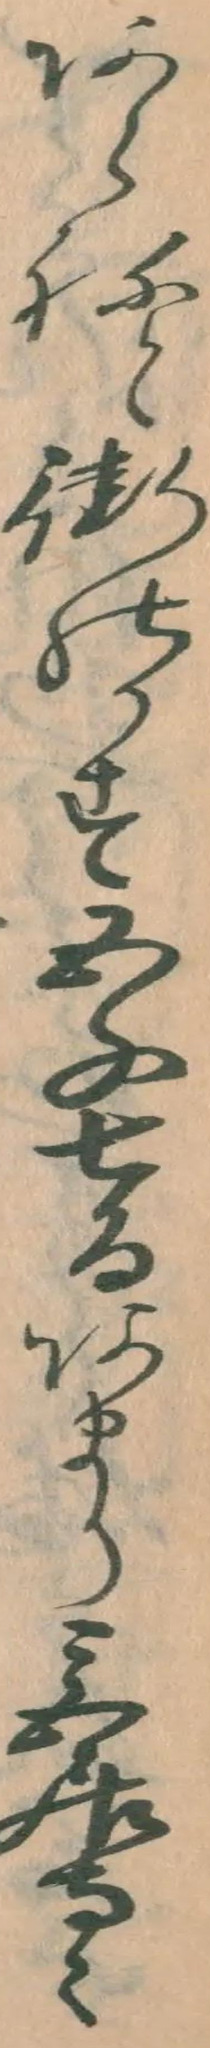あらねと街のかす五千七百あまり宮居寺は
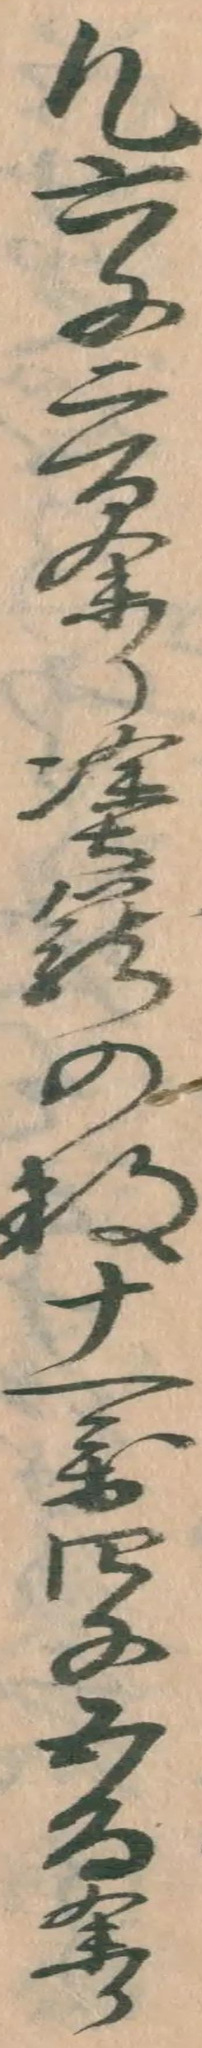凡六千二百余り塗籠の数十一萬四千五百余り
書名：麗斎叢書. 20
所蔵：国立国会図書館 National Diet Library, JAPAN
